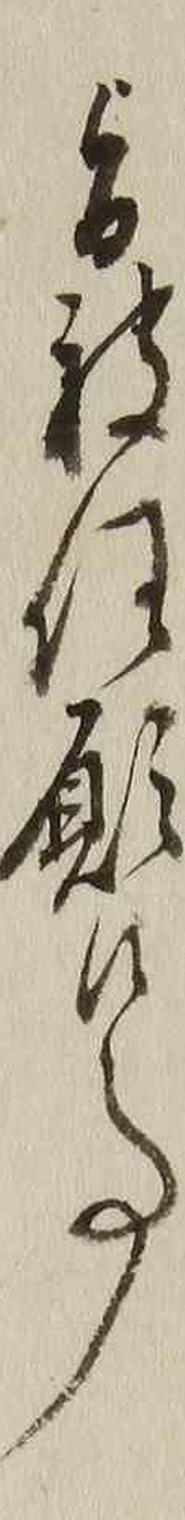旨被任願候事
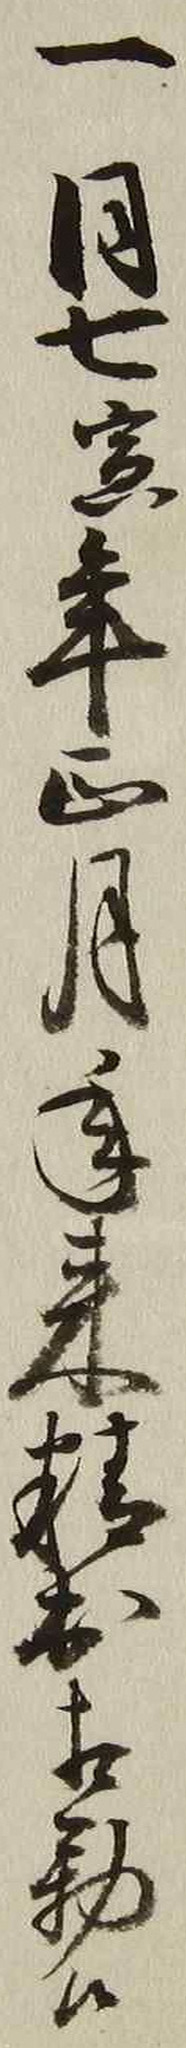一同七寅年正月年来精出相勤候
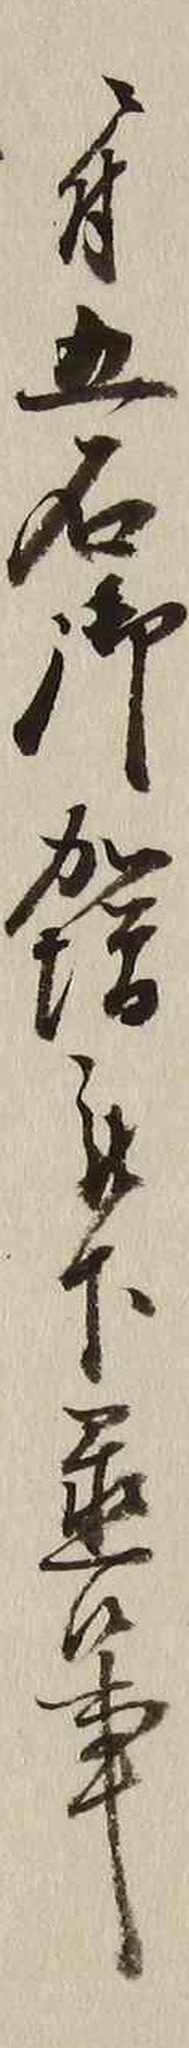ニ付五石御加増被下置候事
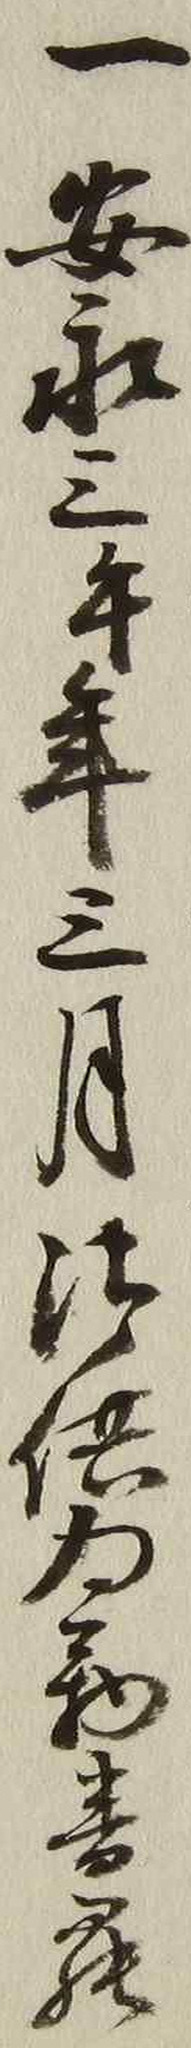一安永三午年三月御供為勤番罷
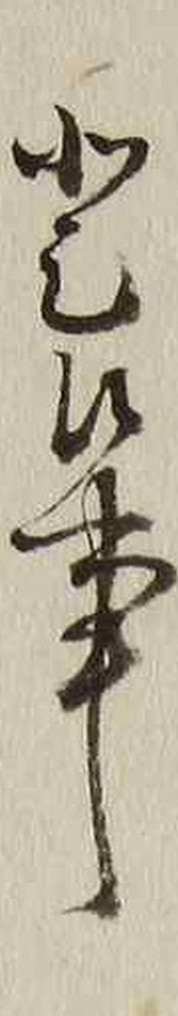登候事
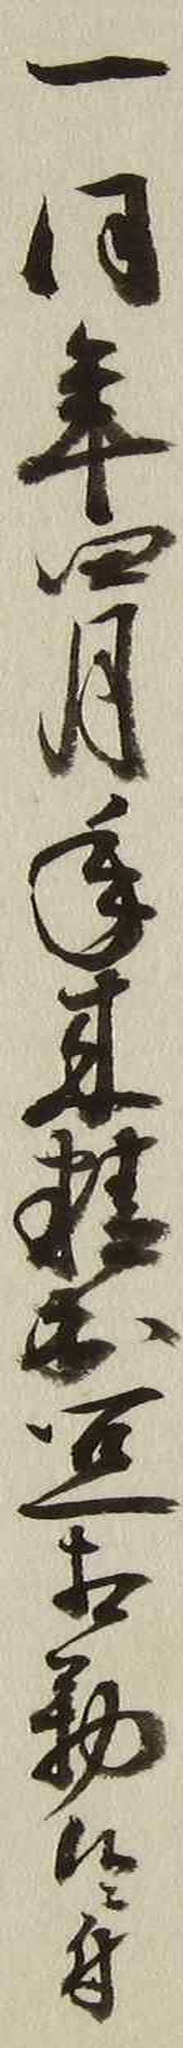一同年四月年来精出宜相勤候ニ付
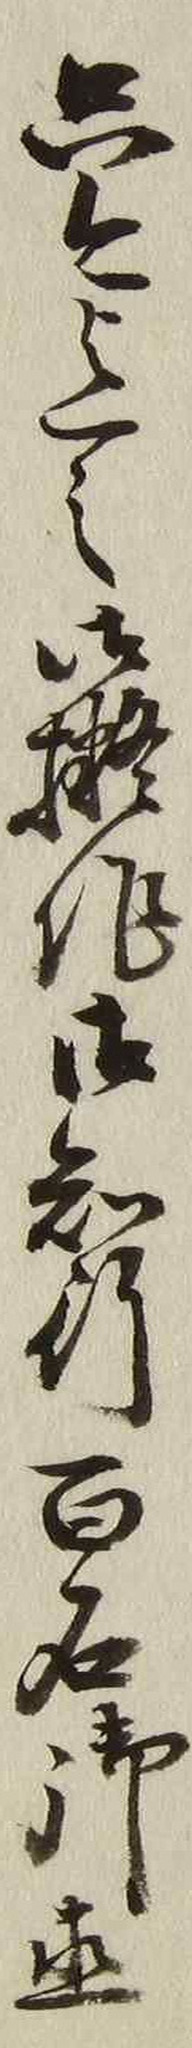只今迄之御擬作御知行百石御直
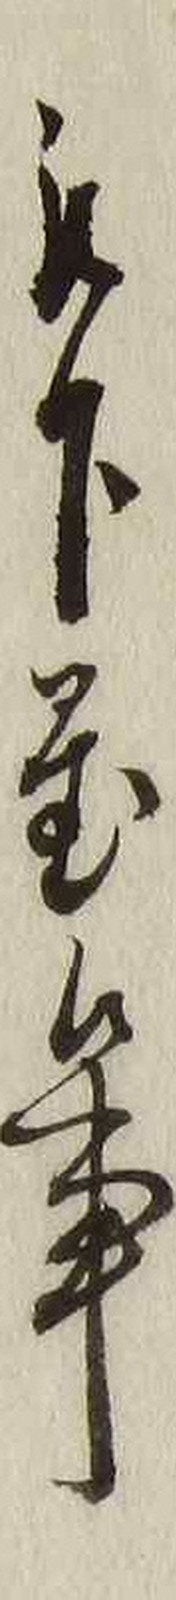被下置候事
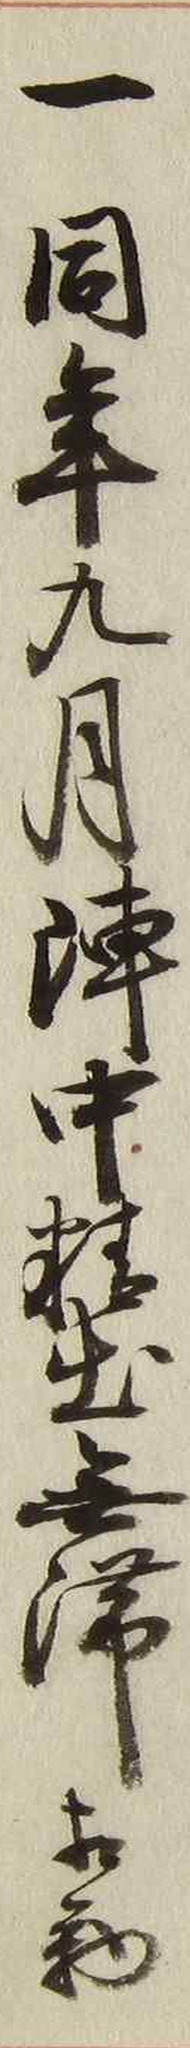一同年九月陣中精出無滞相勤
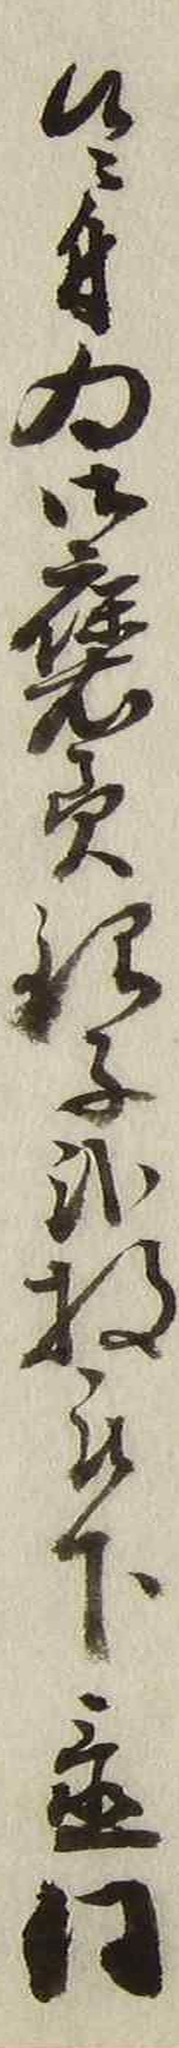候ニ付為御褒美銀子弐枚被下置同
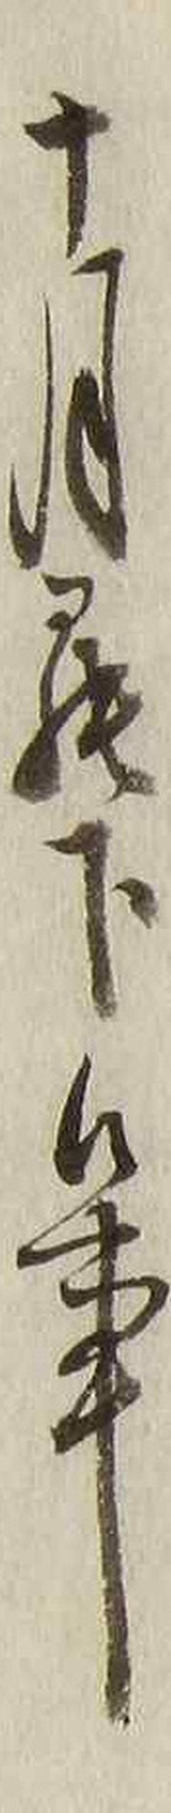十月罷下候事

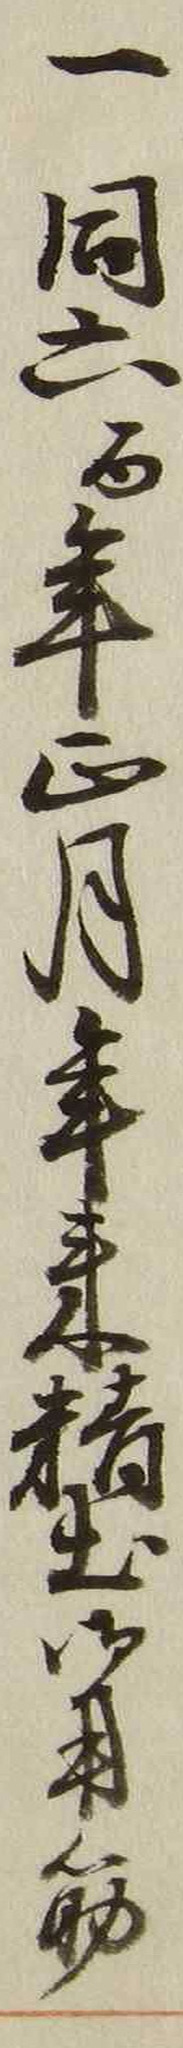一同六酉年正月年来精出御用筋
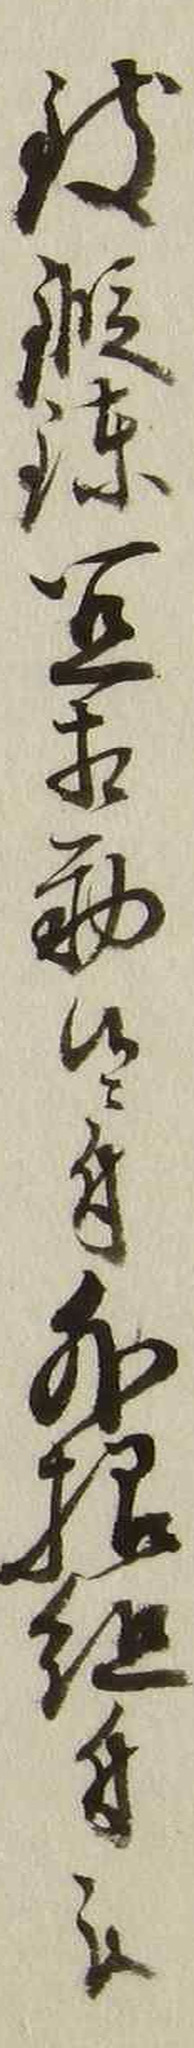致鍛錬宜相勤候ニ付外様組付被
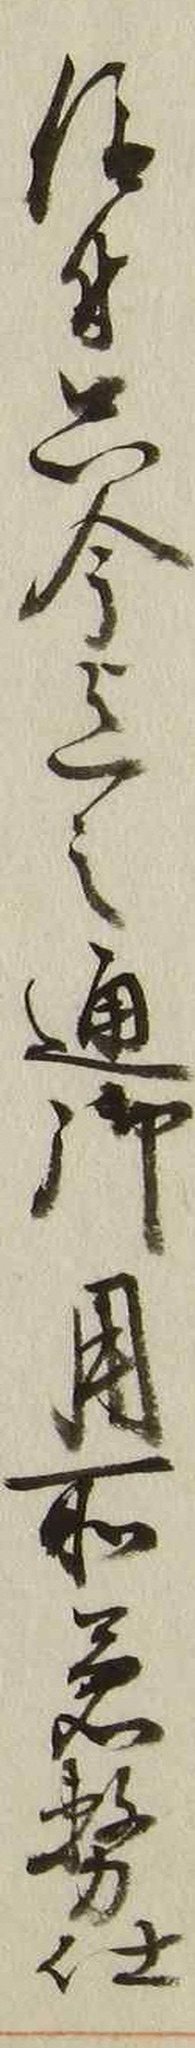仰付只今迄之通御用所兼務仕
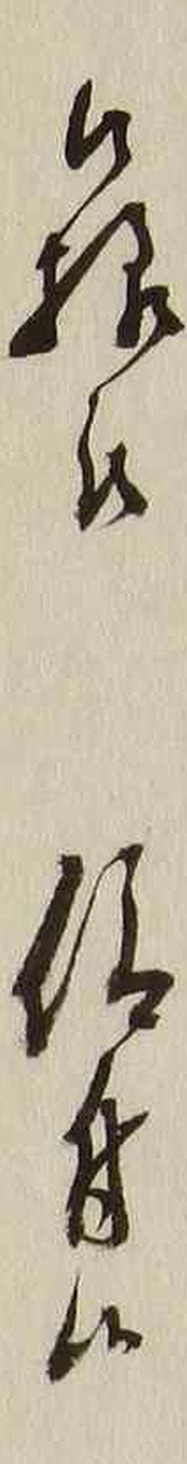候様被仰付候
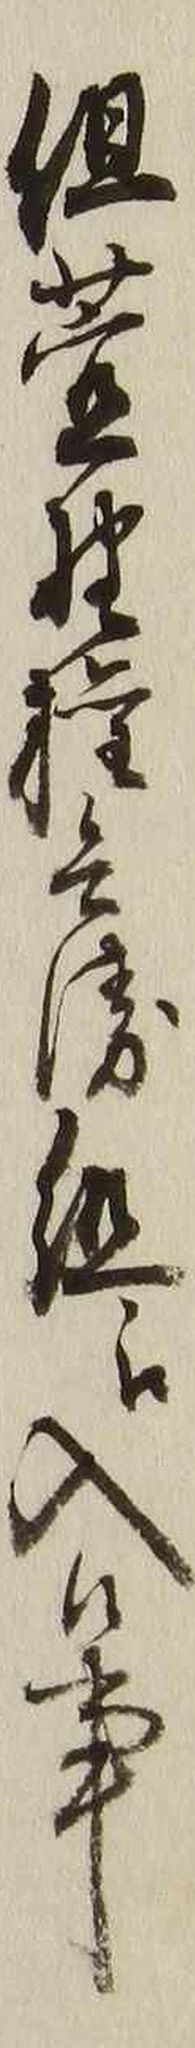但萱野権兵衛組江入候事
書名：諸士系譜　巻之27　い之部27
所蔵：会津若松市立会津図書館
